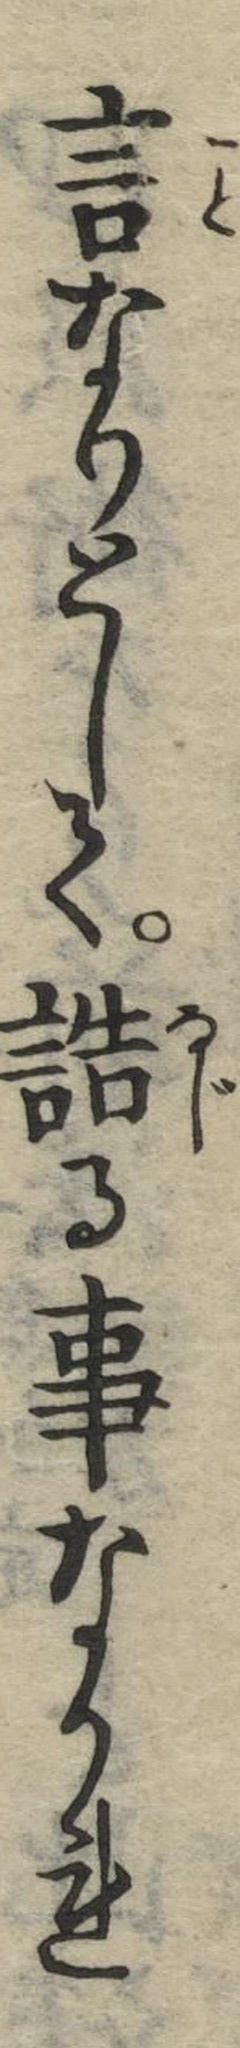言なりとして。詰る事なかれ
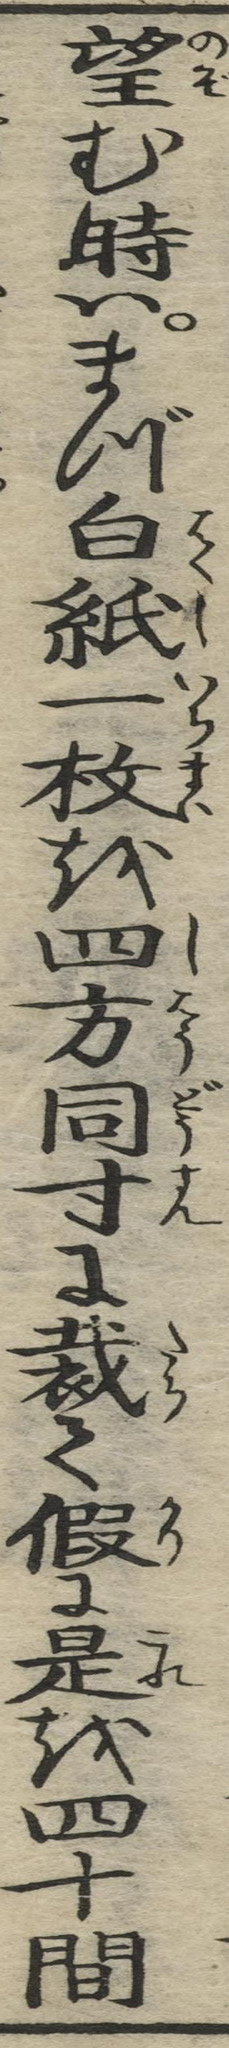望む時は。まづ白紙一枚を四方同寸に裁て仮に是を四十間

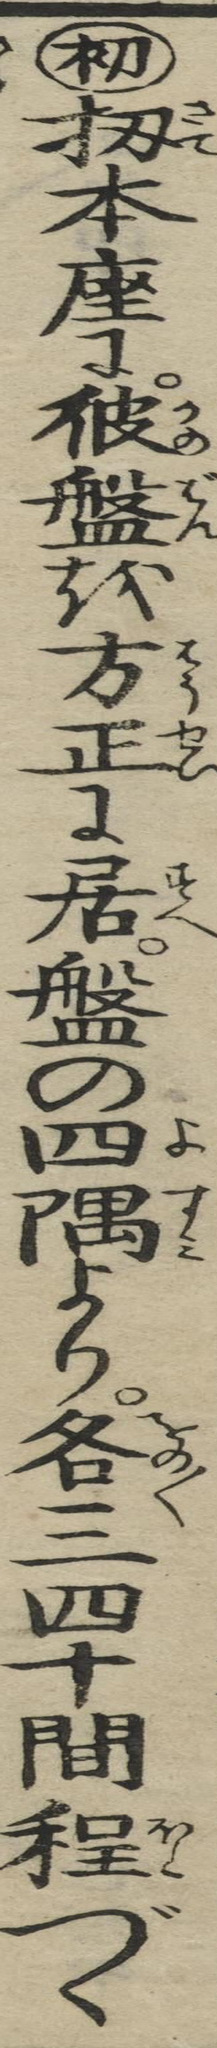初扨本座に。彼盤を方正に居。盤の四隅より。各三四十間程づゝ
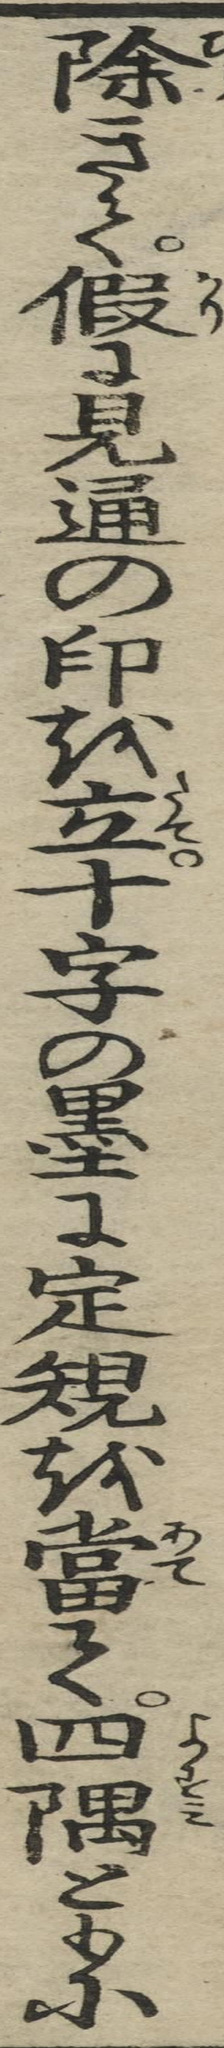除きて。仮に見通の印を立。十字の墨に定規を当て。四隅ともに
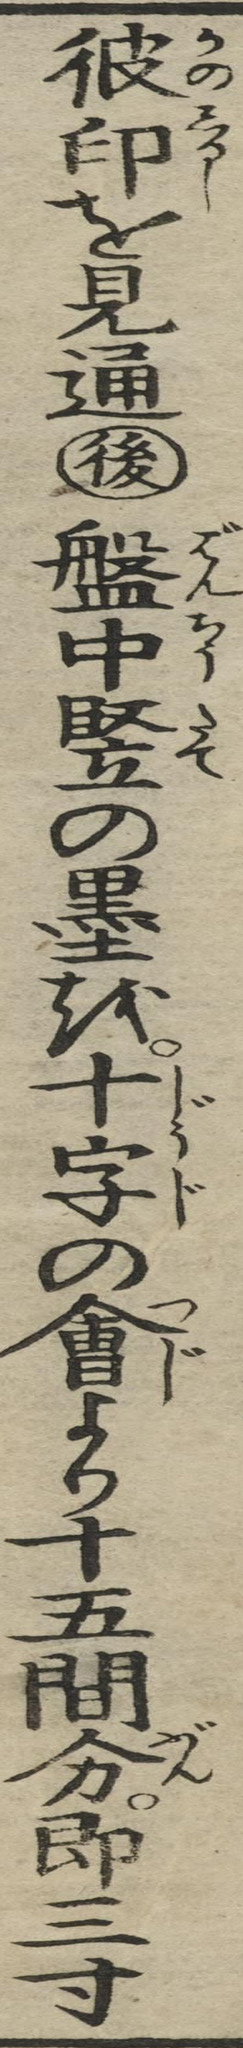彼印を見通後盤中竪の墨を。十字の会より十五間分。即三寸
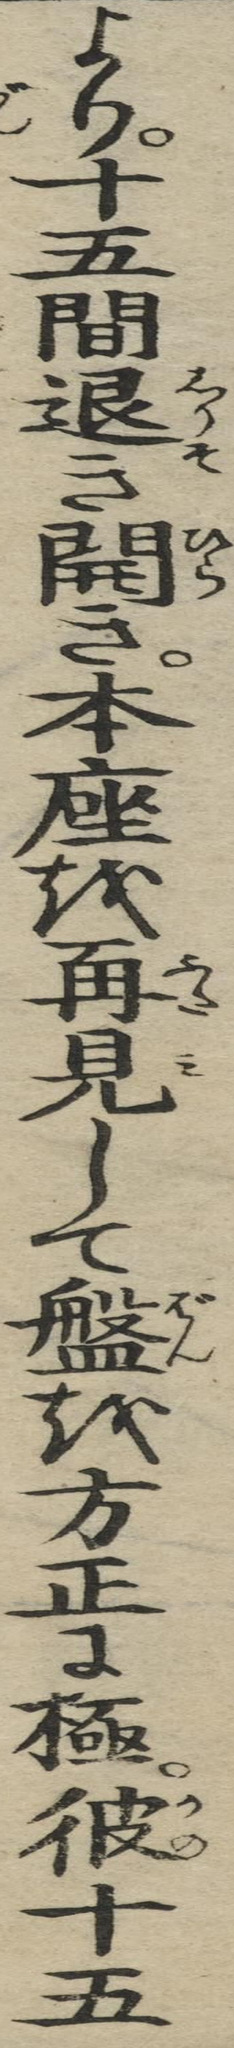より。十五間退き開き。本座を再見して盤を方正に極。彼十五
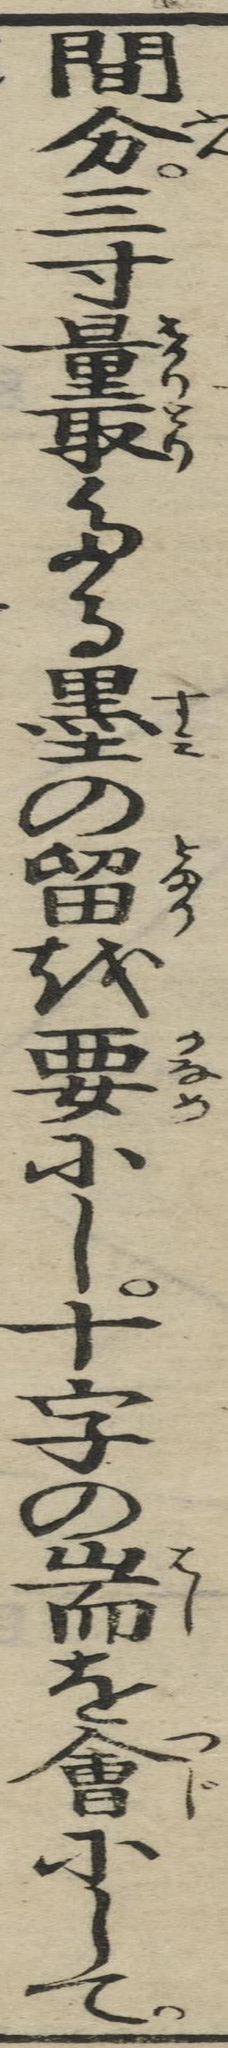間分。三寸量取たる墨の留を要にし。十字の端を会にして。
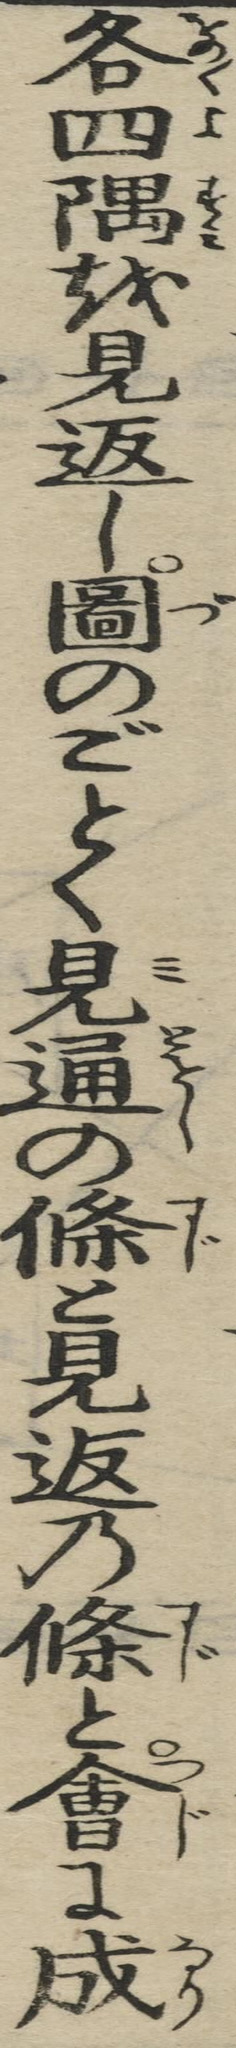各四隅を見返し。図のごとく見通の條と見返の條と。会に成
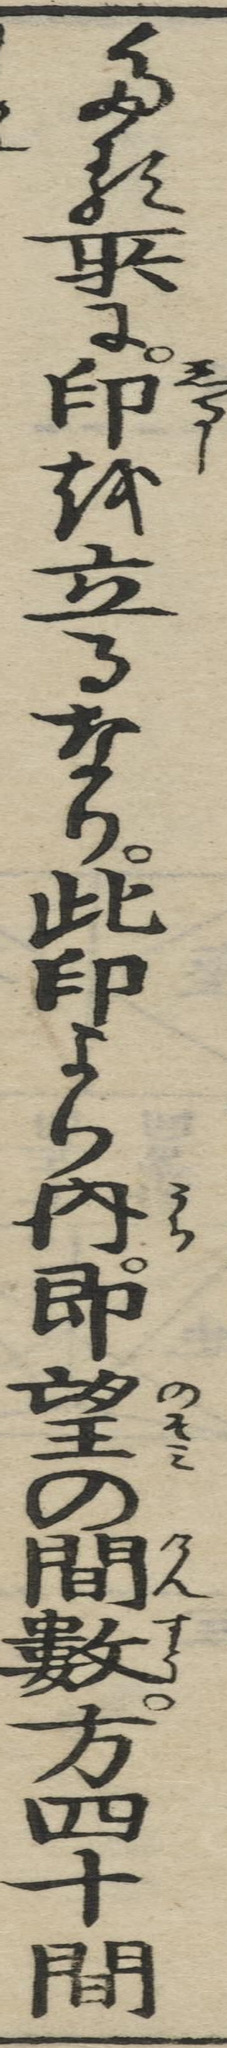たる所に。印を立るなり。此印より内。即望の間数。方四十間
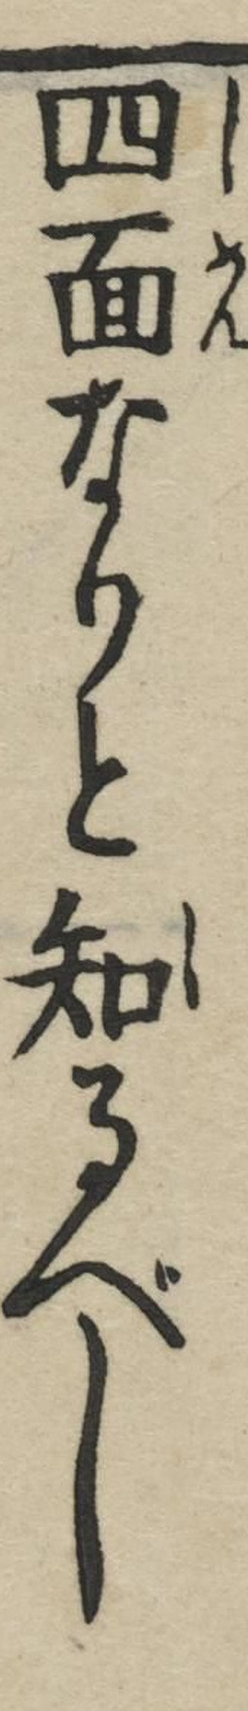四面なりと知るべし
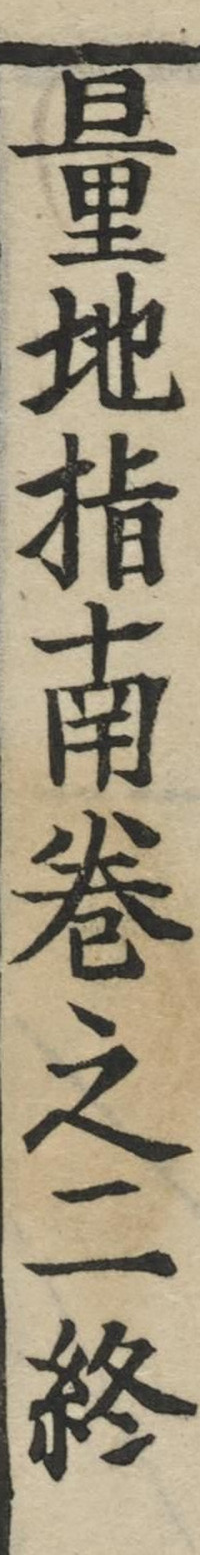量地指南巻之二終
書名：量地指南　巻之二（内題）
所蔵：東京大学地震研究所図書室 Earthquake Research Institute Library, The University of Tokyo, JAPAN
